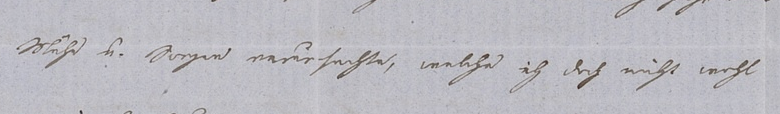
Mühe u. Sorgen verursachte, welche ich doch nicht wohl
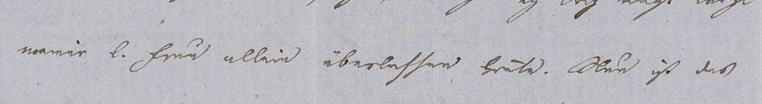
meiner l. Frau allein überlassen konnte. Nun ist das
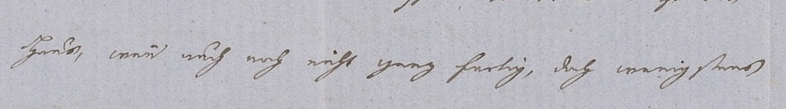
Haus, wenn auch noch nicht ganz fertig, doch wenigstens
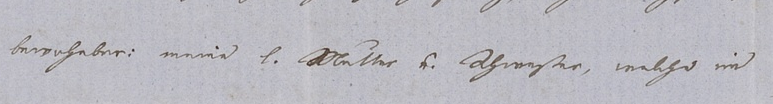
bewohnbar: meine l. Mutter u. Schwester, welche im
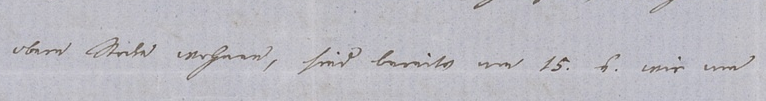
obern Stocke wohnen, sind bereits am 15. u. wir am
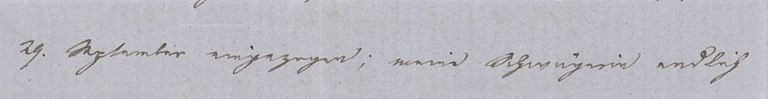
29. September eingezogen; meine Schwägerin endlich
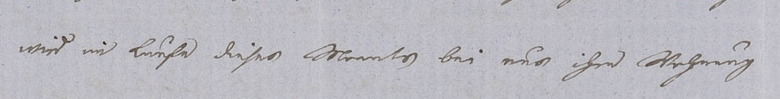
wird im Laufe dieses Monats bei uns ihre Wohnung
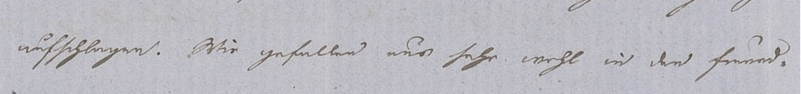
aufschlagen. Wir gefallen uns sehr wohl in den freund-
